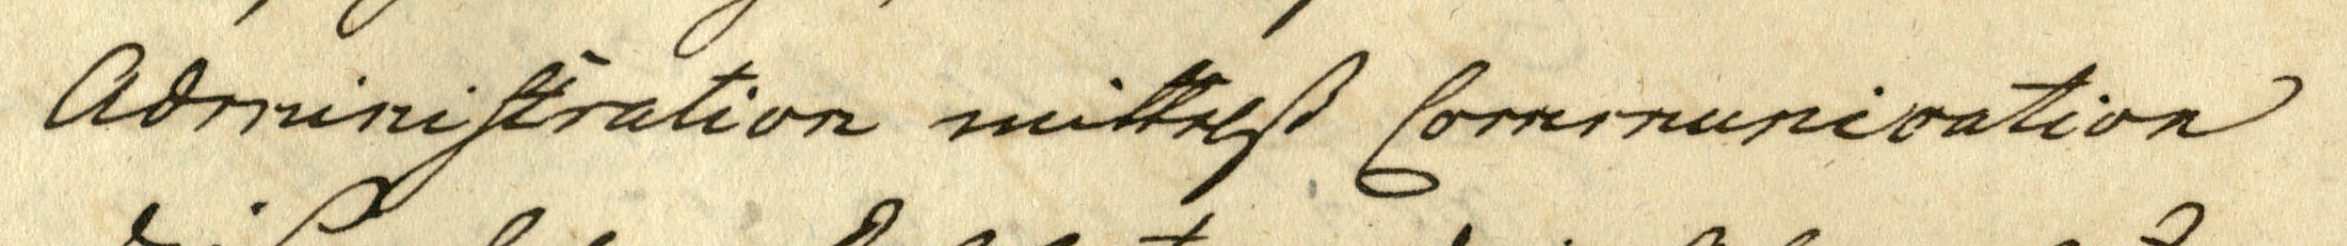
Administration mittelst Communication
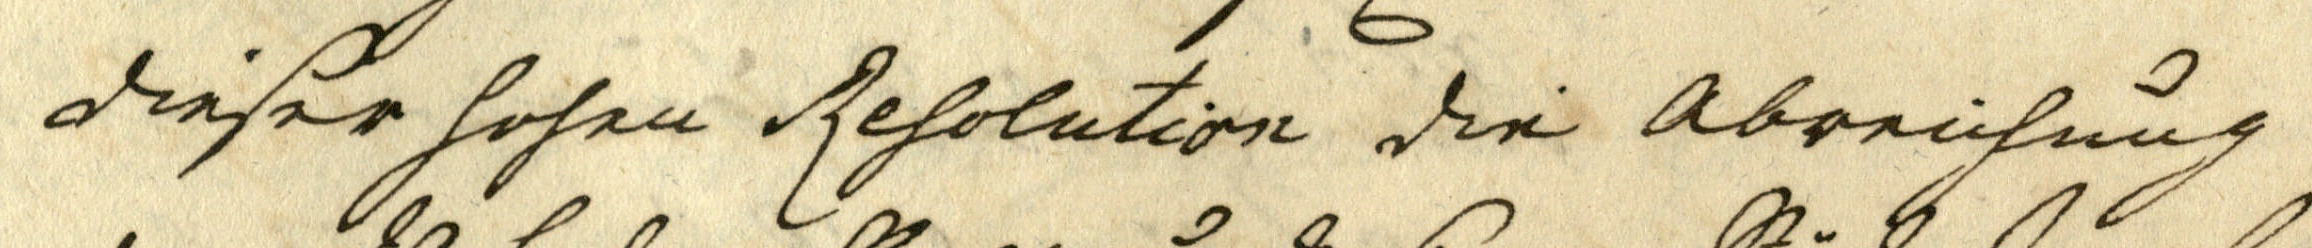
dieser hohen Resolution die Abreichung
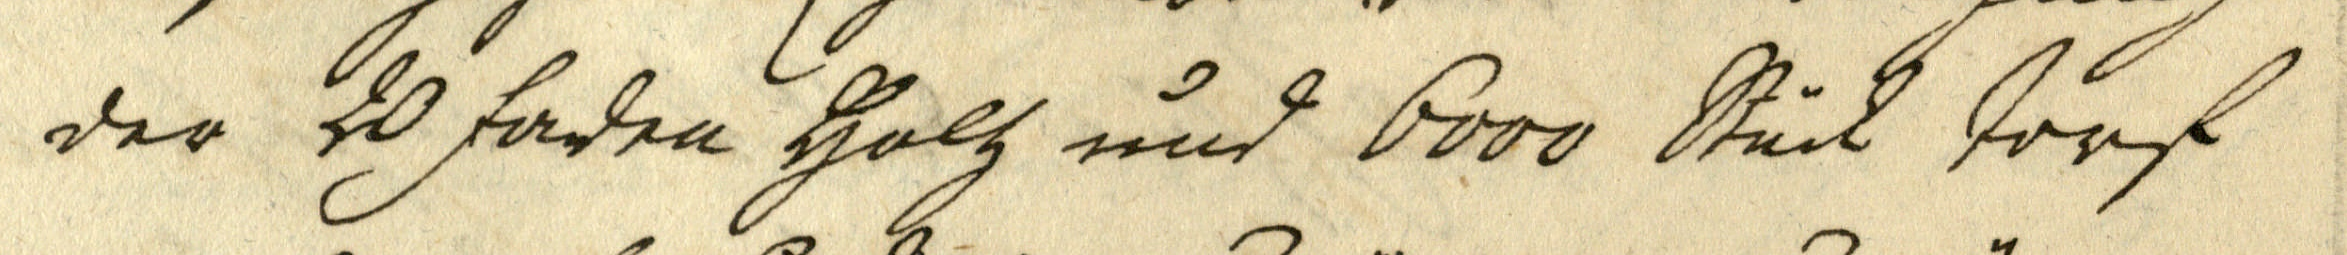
der 20 Faden Holz und 6000 Stück Torf
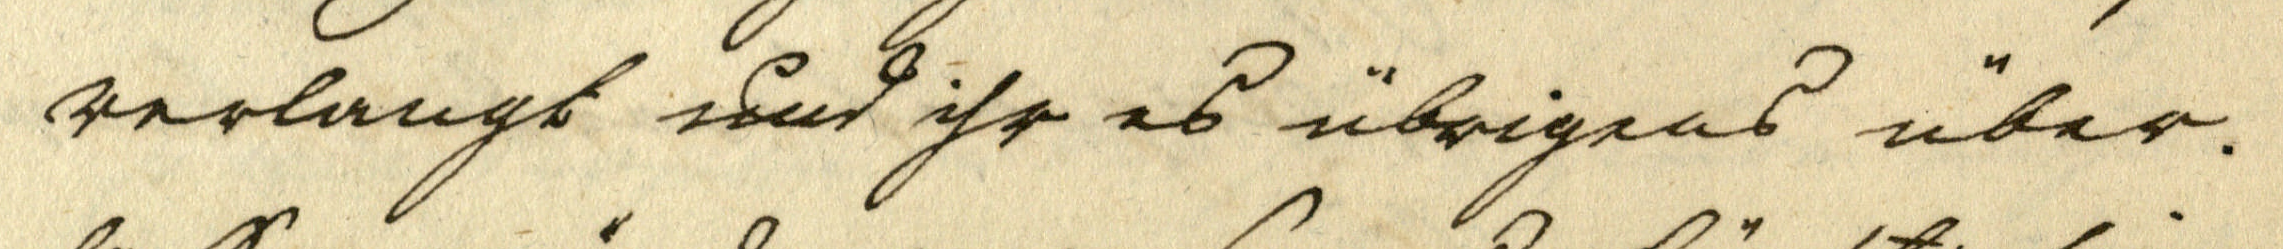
verlangt den ihr es übrigens über¬
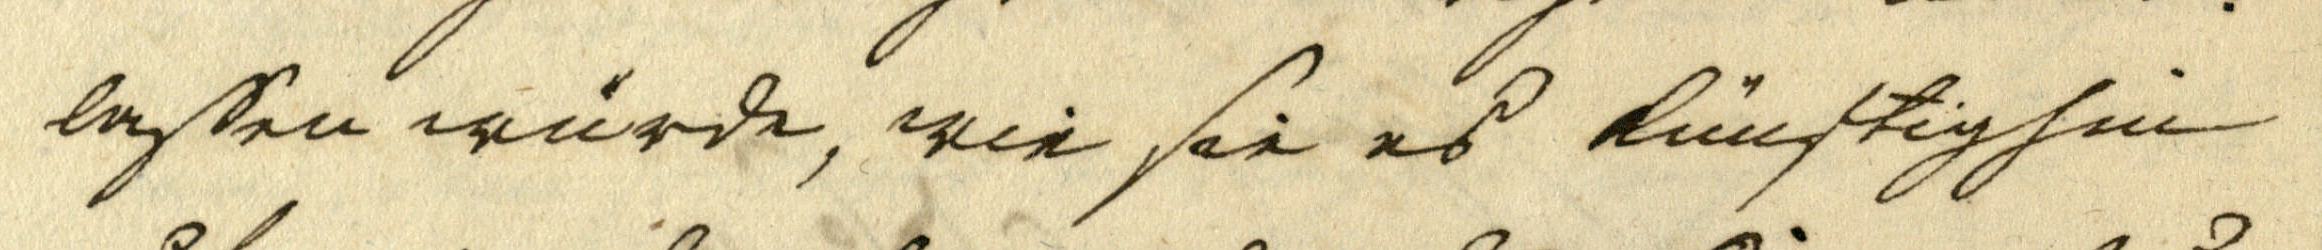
lassen würde, wie sie es künftighin
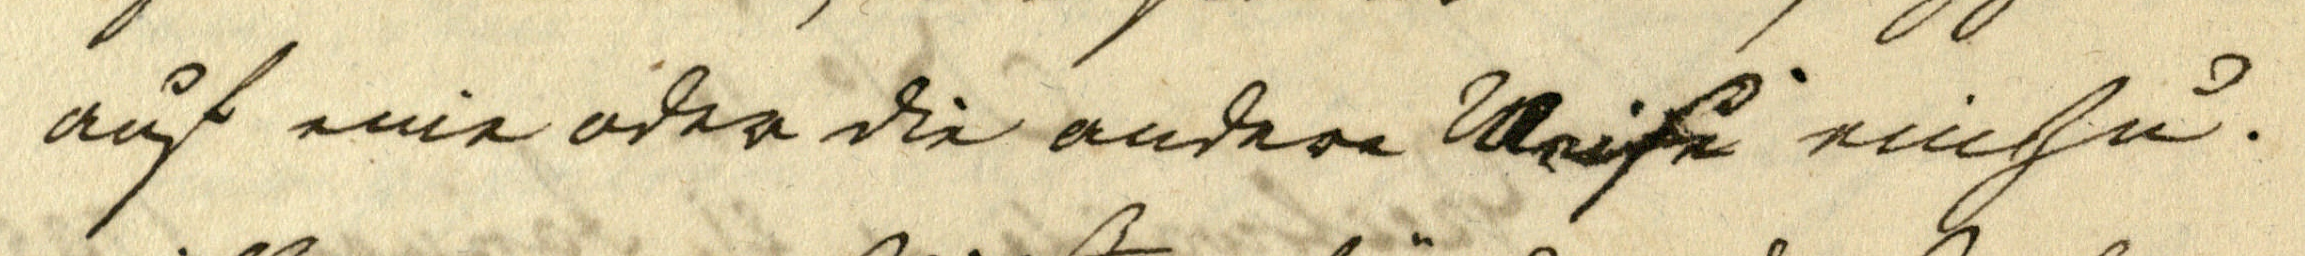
auf eine oder die andere Weise einzu¬
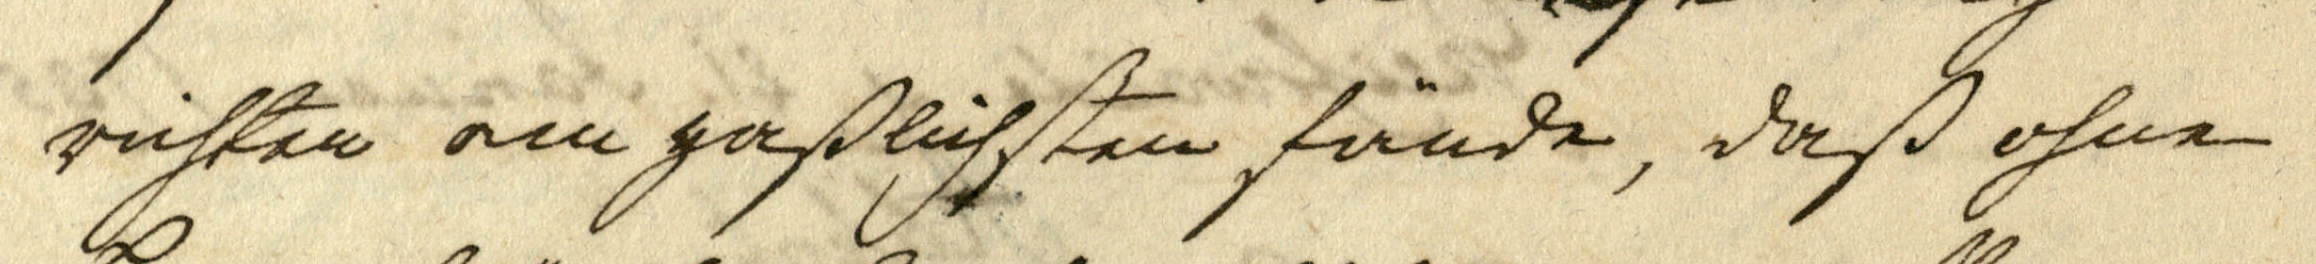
richten am paßlichsten fände, daß ohne
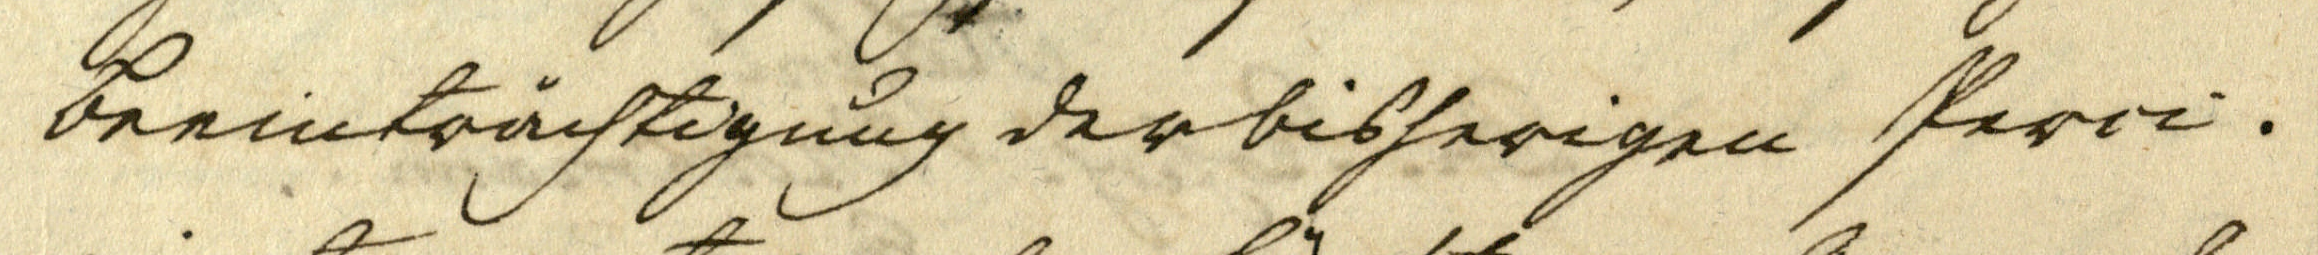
Beeinträchtigung der bisherigen Perci¬
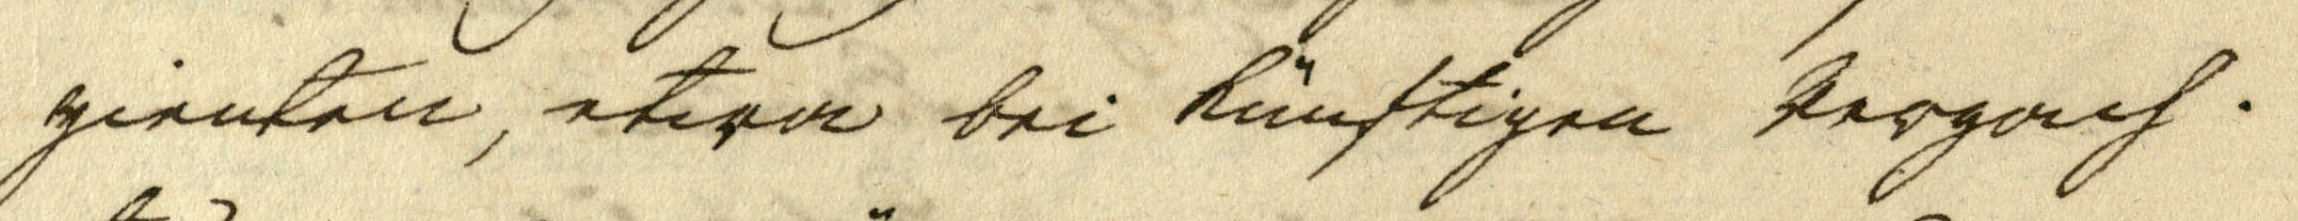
pienten, etwa bei künftigen Verpach¬
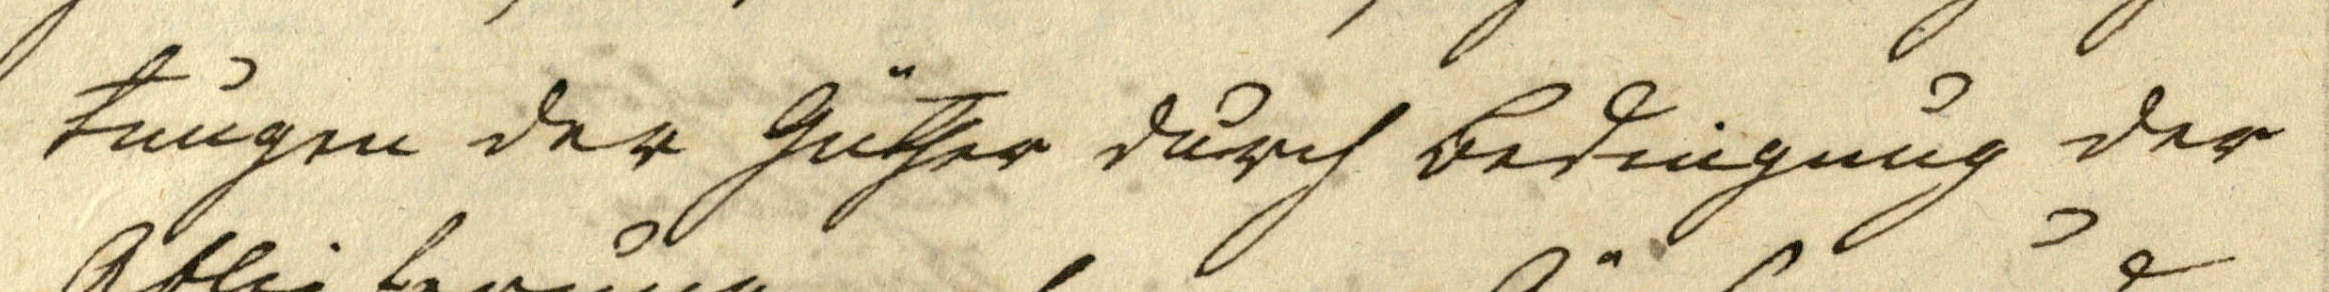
tungen der Güther durch Bedingung der
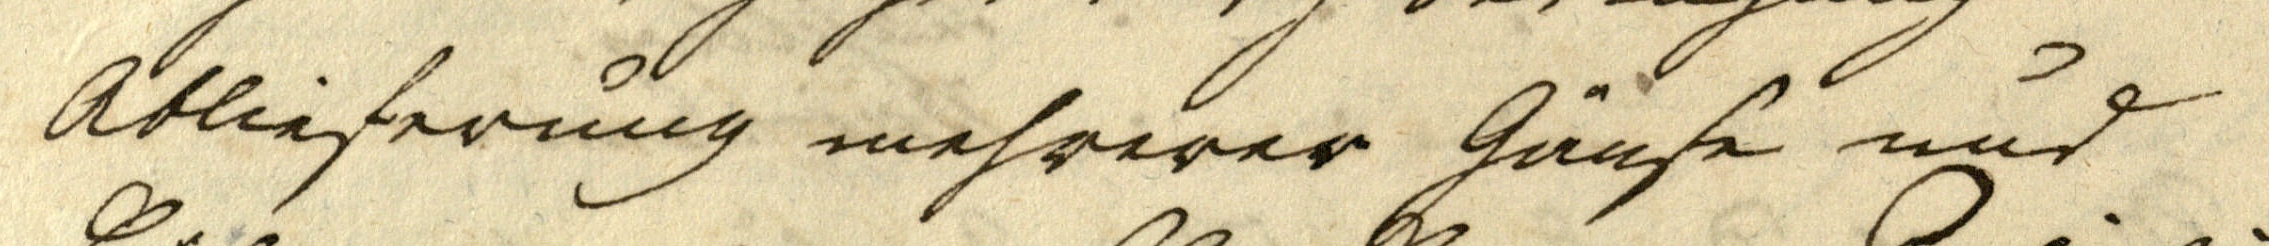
Ablieferung mehrerer Gänse und
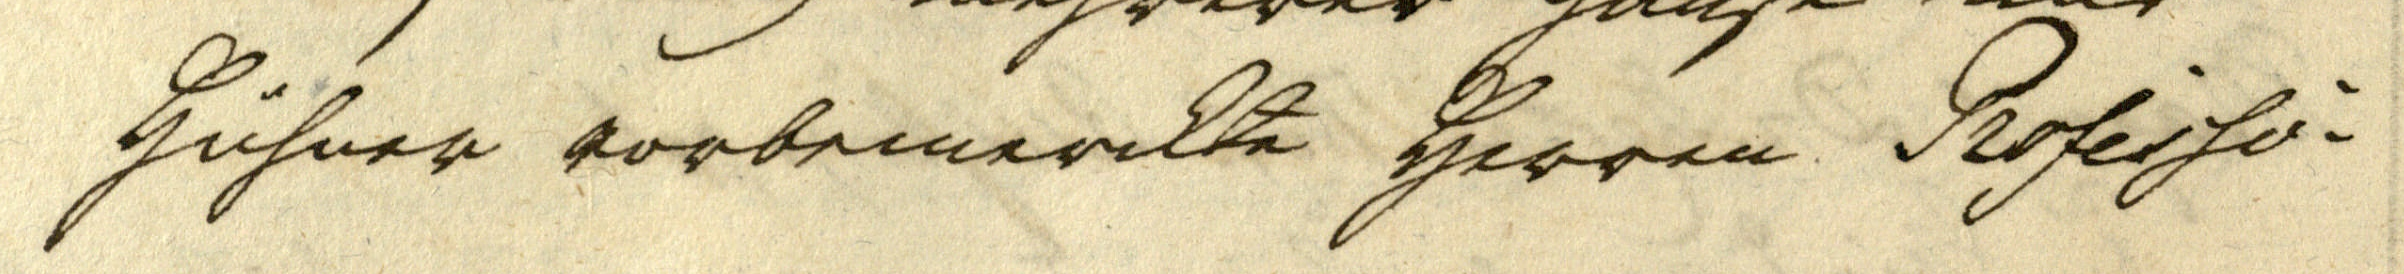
Hühner vorbemerckte Herren Professo¬
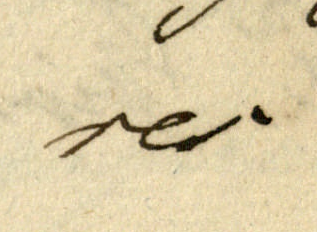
res
